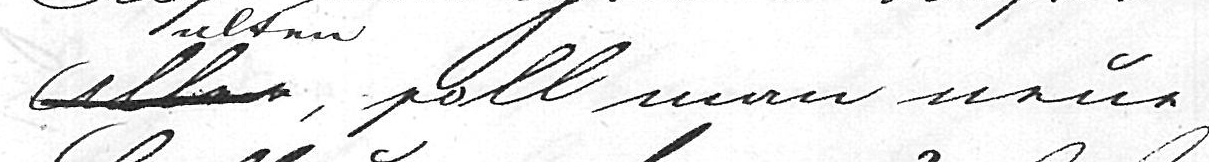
aller, soll man neue
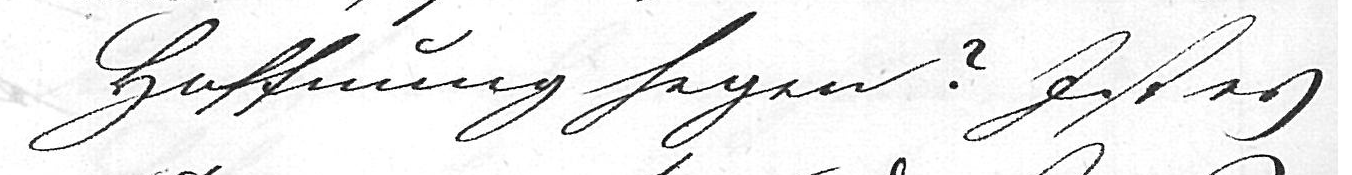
Hoffnung hegen? Ist es
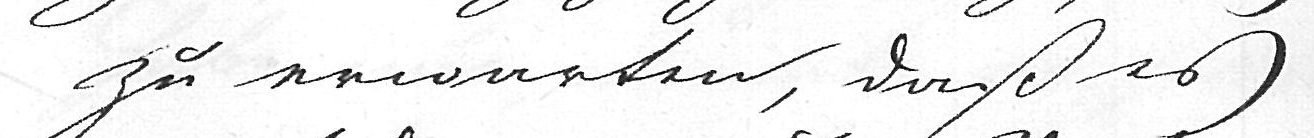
zu erwarten, daß es
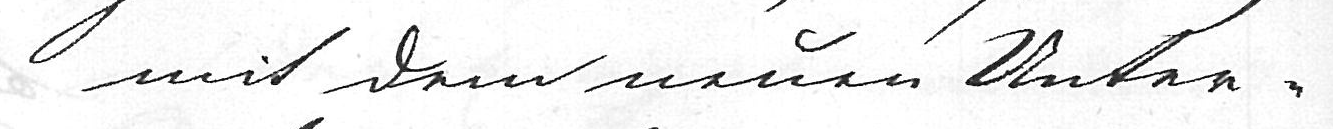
mit dem neuen Unter-
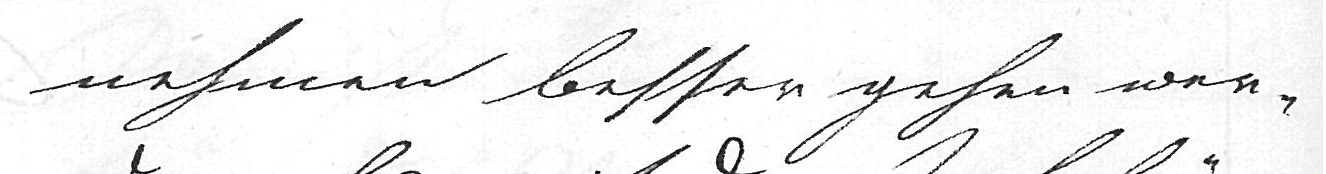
nehmen besser gehen wer-
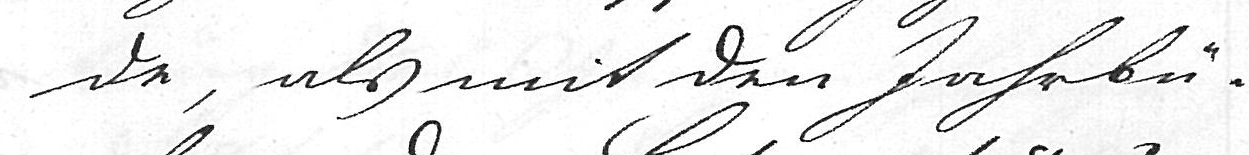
de, als mit den Jahrbü-
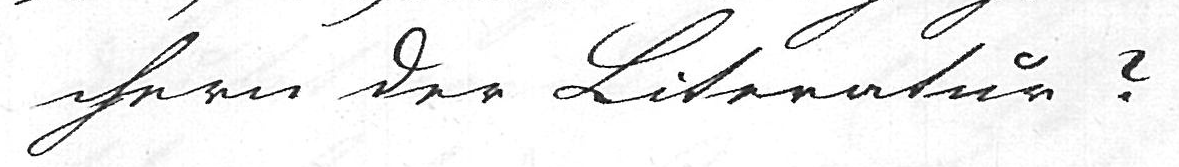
chen der Literatur?
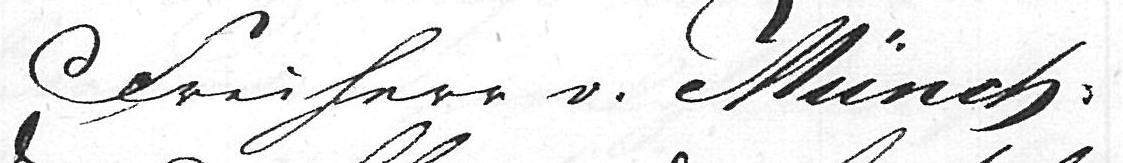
Freiherr v. Münch:
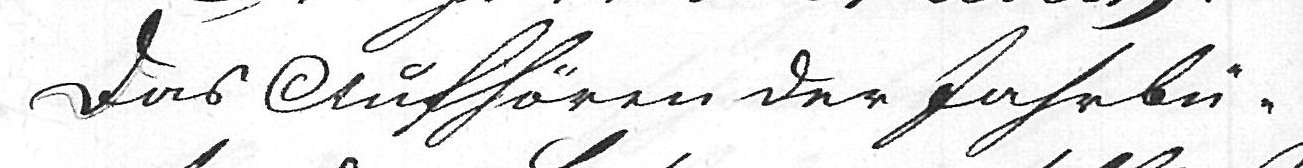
Das Aufhören der Jahrbü-
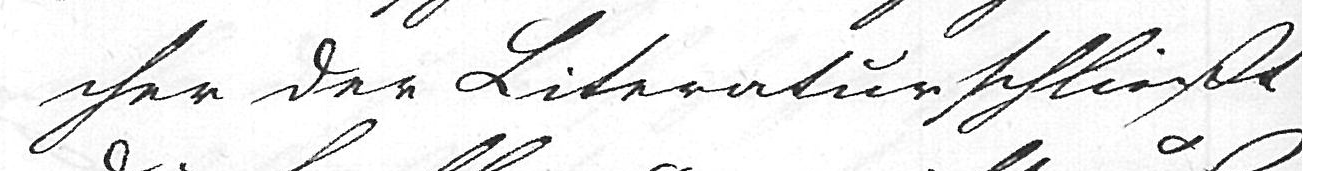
cher der Literatur schließt
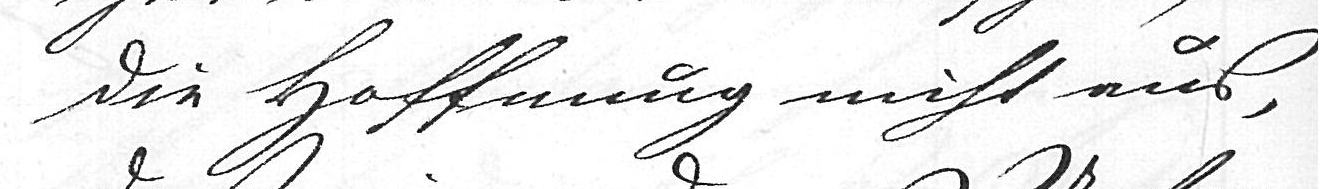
die Hoffnung nicht aus,
